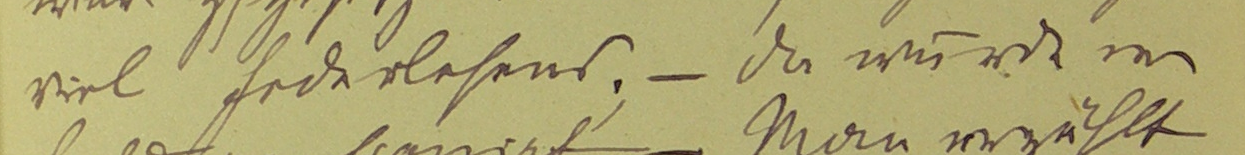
viel Federlesens. - Da wurde er
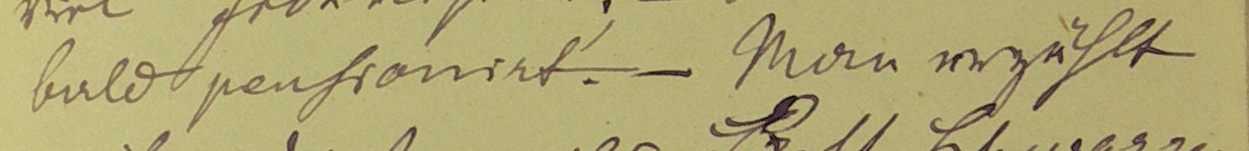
bald pensioniert. - Man erzählt
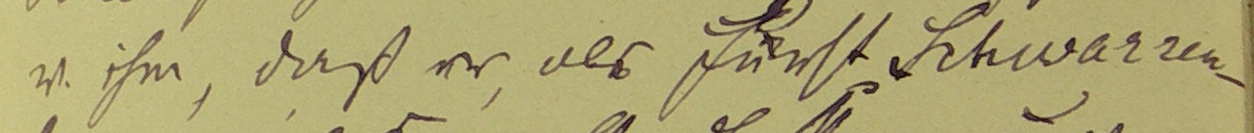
von ihm, daß er, als Fürst Schwarzen¬
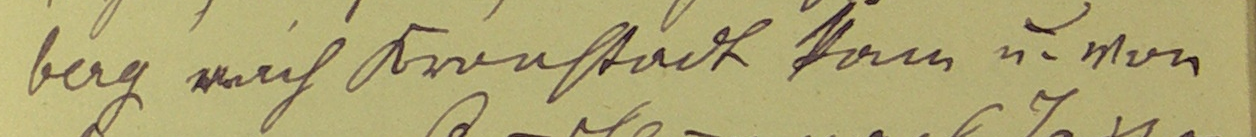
berg nach Kronstadt kam u. von
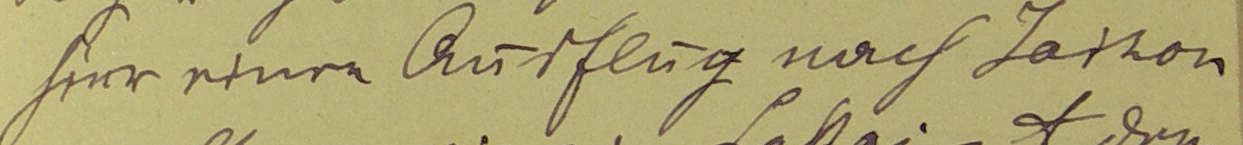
hier einen Ausflug nach Zaizon
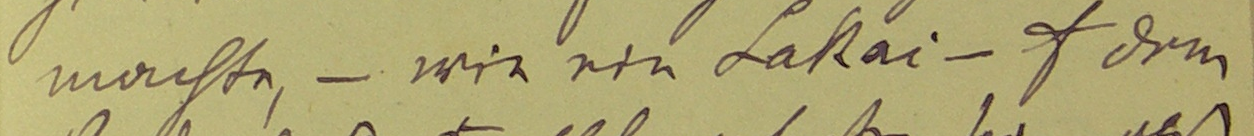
machte, - wie ein Lakai - f dem
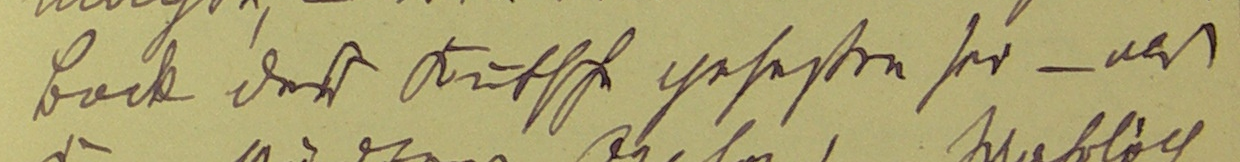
Bock der Kutsche gesesßen sei - als
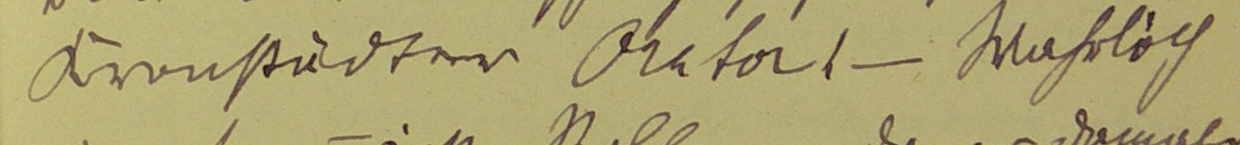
Kronstädter Orator! - Wahrlich
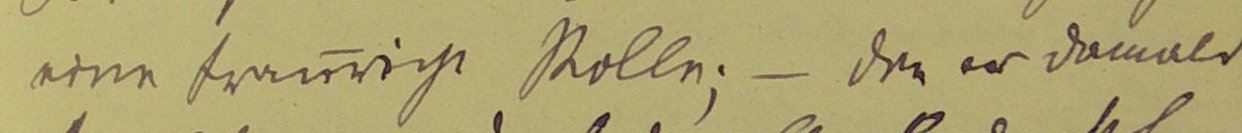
eine traurige Rolle; - die er damals
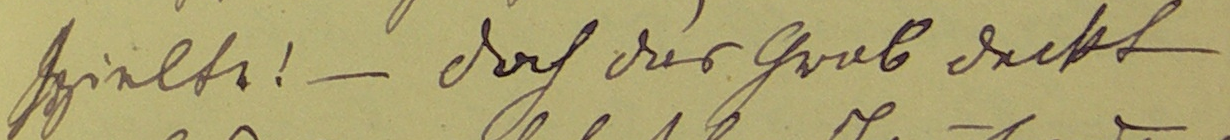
spielte! - doch das Grab deckt
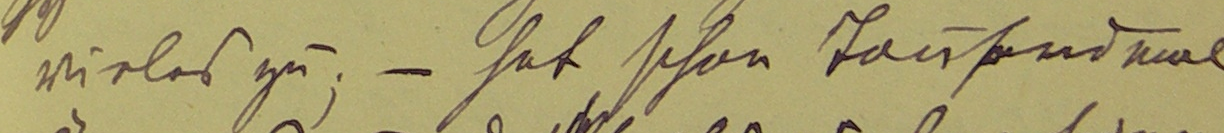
vieles zu; - hat schon Tausendmal
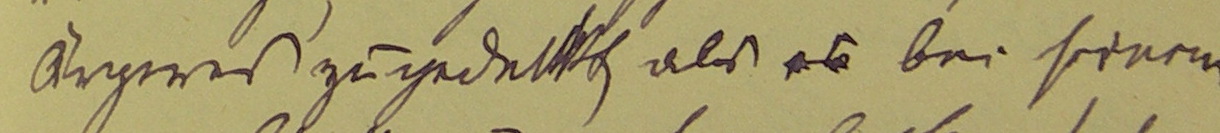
Ärgeres zugedeckt, als bei seinem
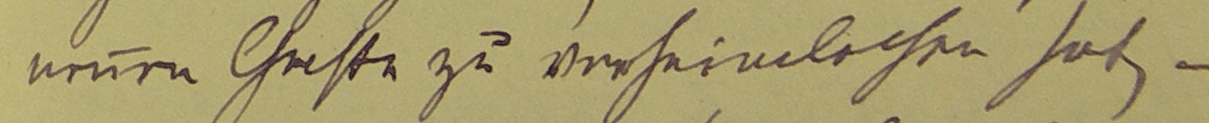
neuen Geiste zu verheimlichen hat, -
